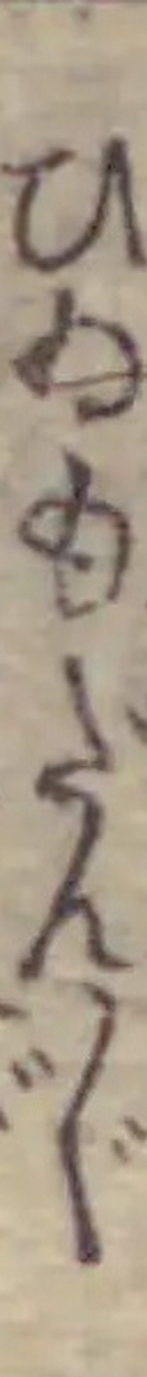ひゐもだん〴〵
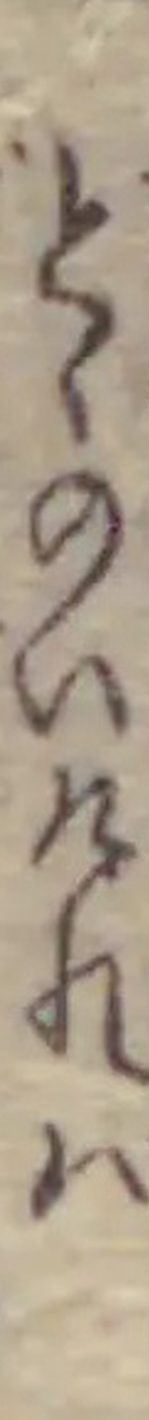とゝのいければ
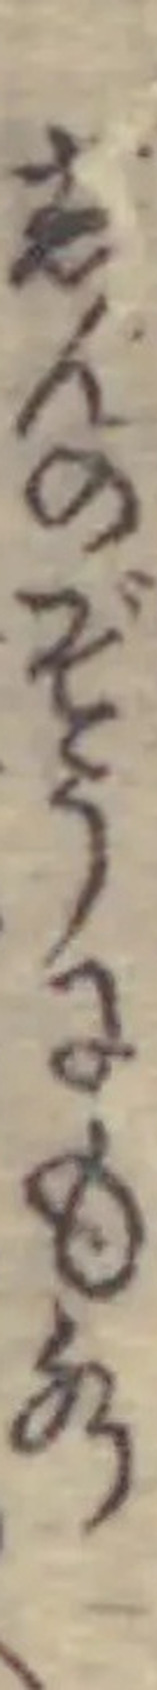しんのぞうにも水
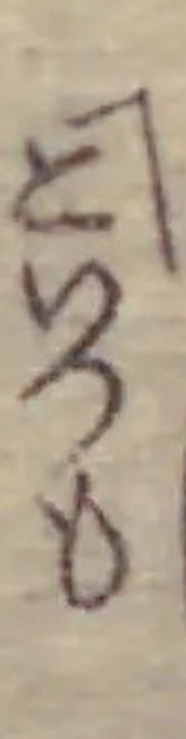〽こいつも
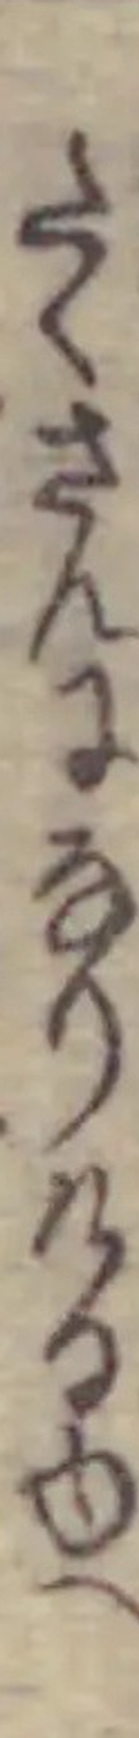たくさんになりけるゆへ
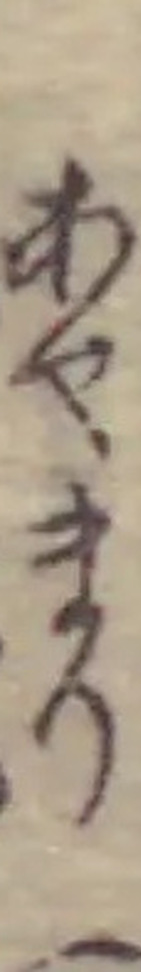あやまり
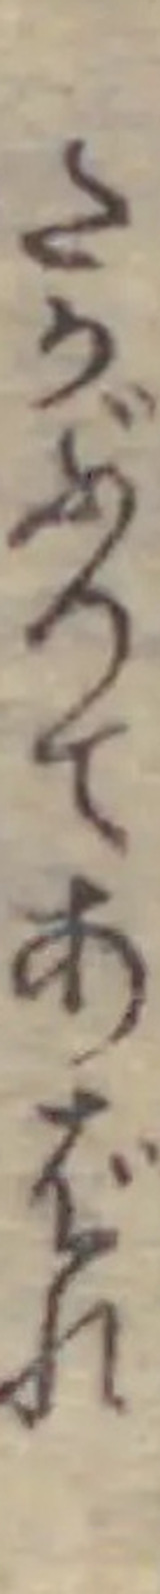たかぶつてあばれ
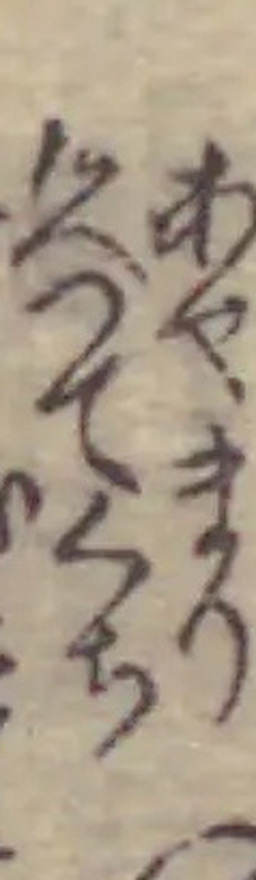けへつてくち
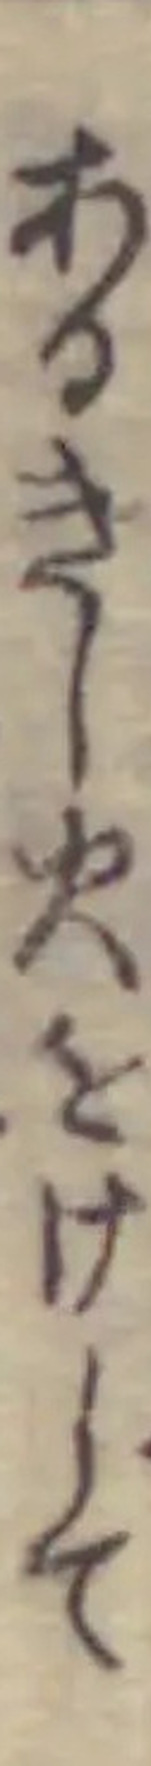あるきし火をけして
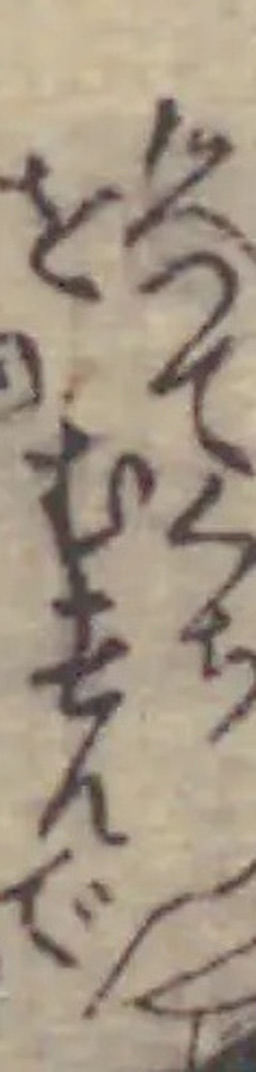をむすんで
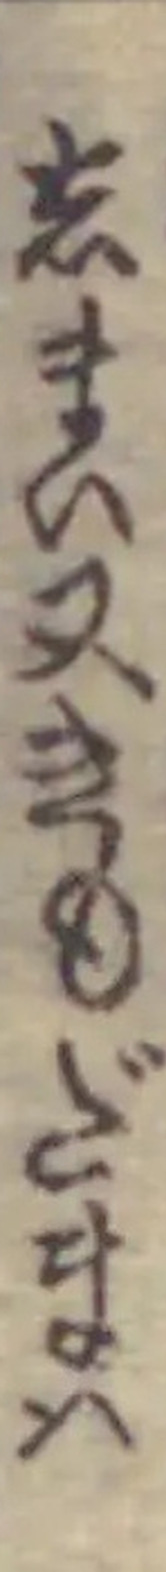しまい又きもだまは
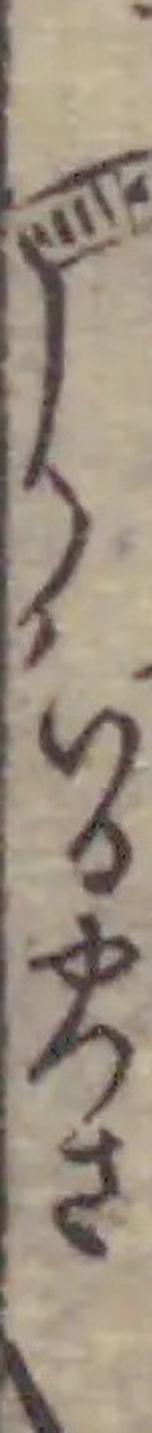いるやつさ
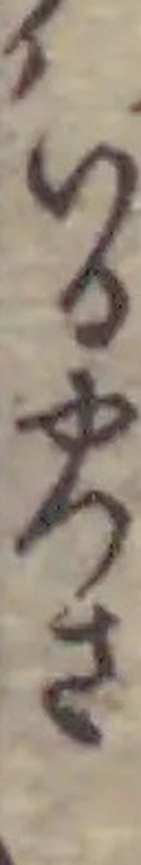いるやつさ
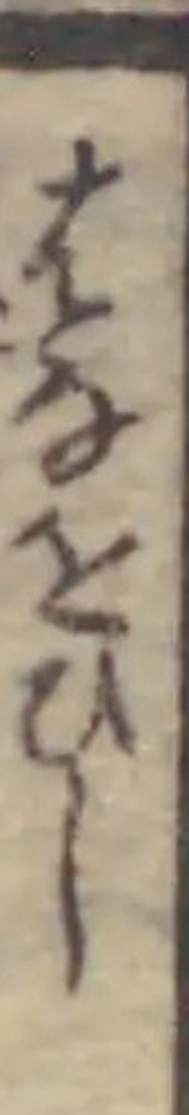はなをひし
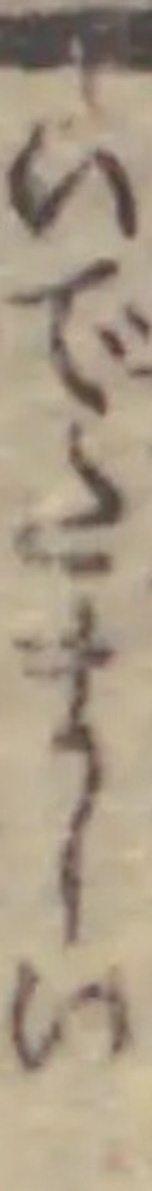いでたましい
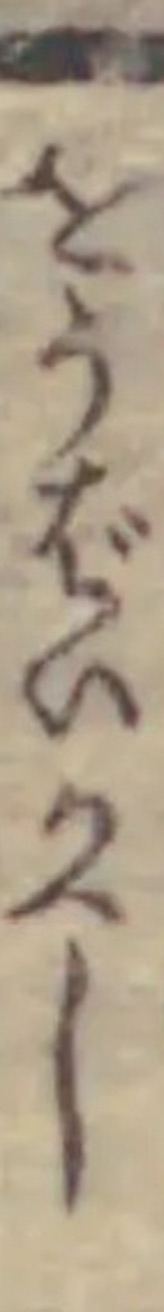をうばいかへし
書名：腹内養生主論 3巻
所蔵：国立国会図書館 National Diet Library, JAPAN
